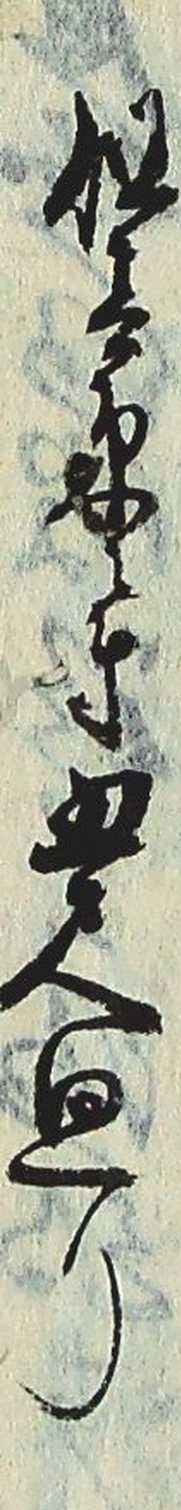但壱束に付五尺廻り
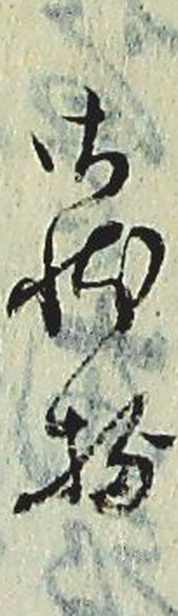御状持
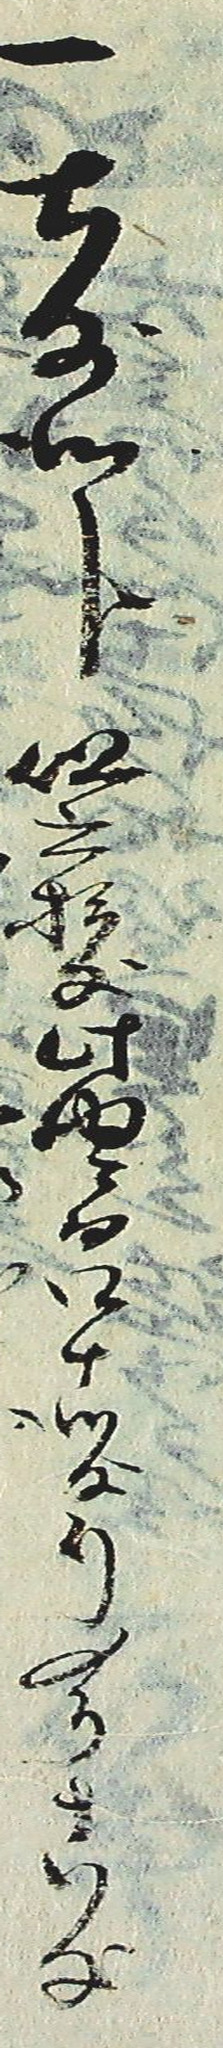一七匁弐分但六拾匁此内にて四拾弐匁引〆り十八匁
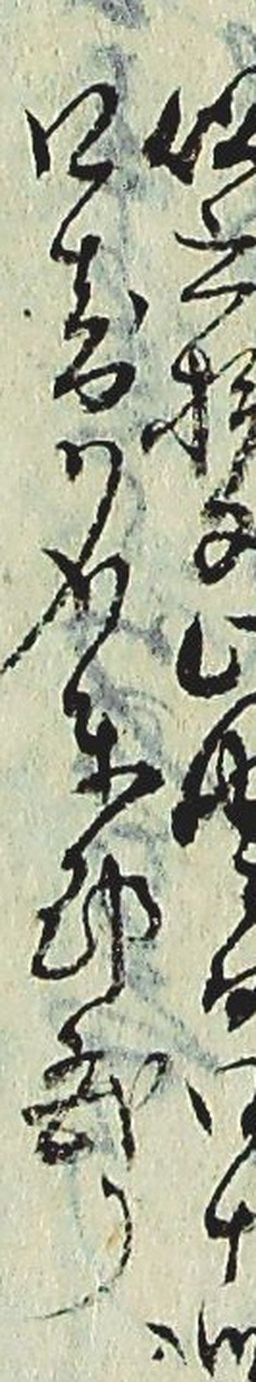四歩名東郡当り
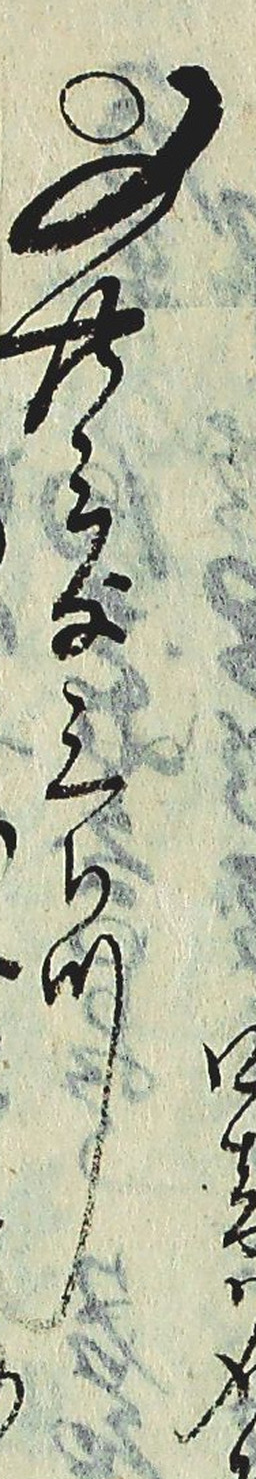〆廿三匁三分弐厘
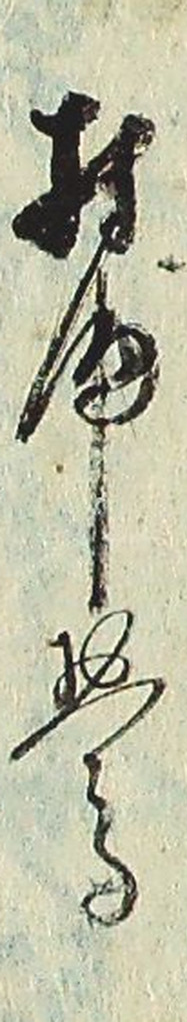村浦惣高

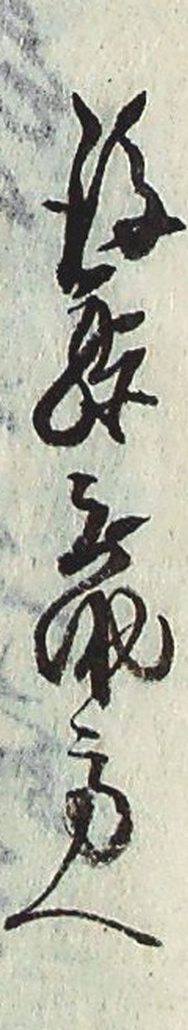後藤庄助方へ
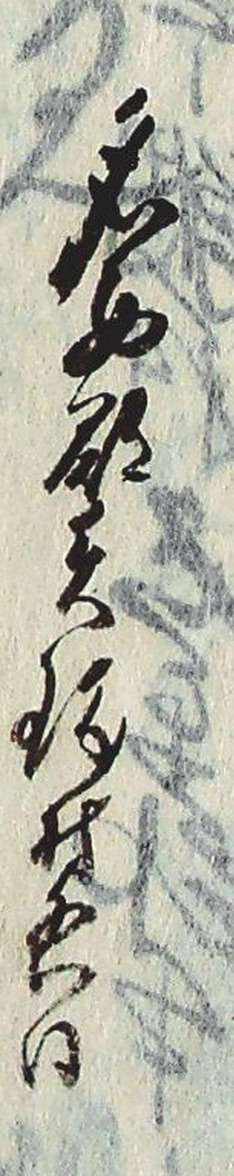名西郡矢野村右同
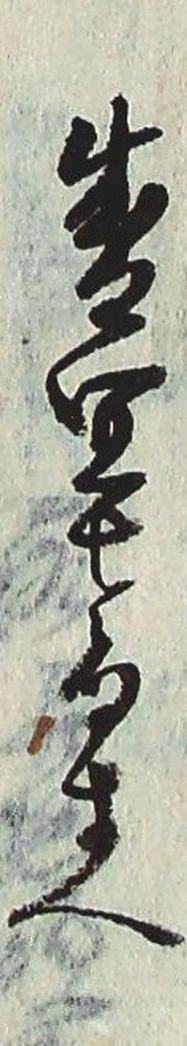盛宣七郎方へ
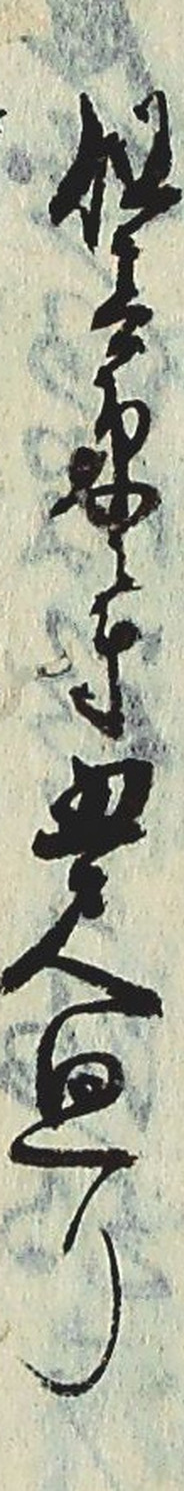但壱束に付五尺廻り
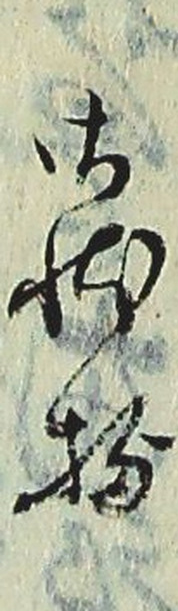御状持
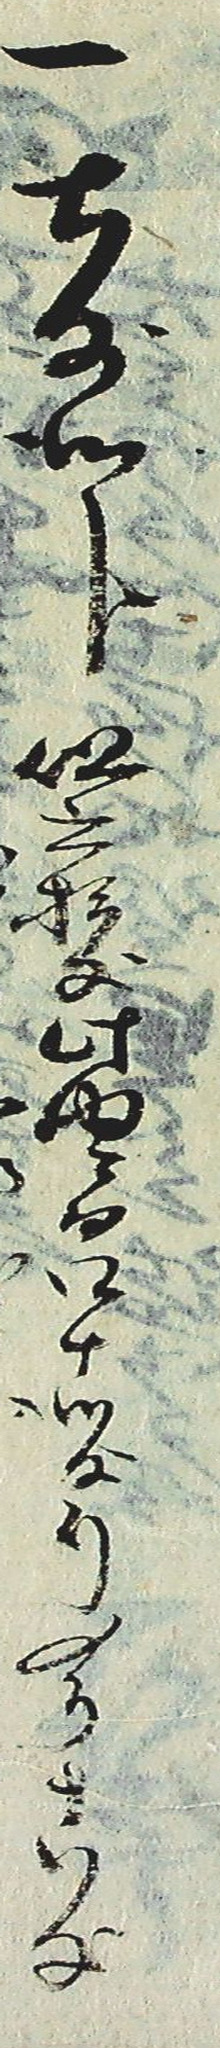一七匁弐分但六拾匁此内にて四拾匁引〆り十八匁
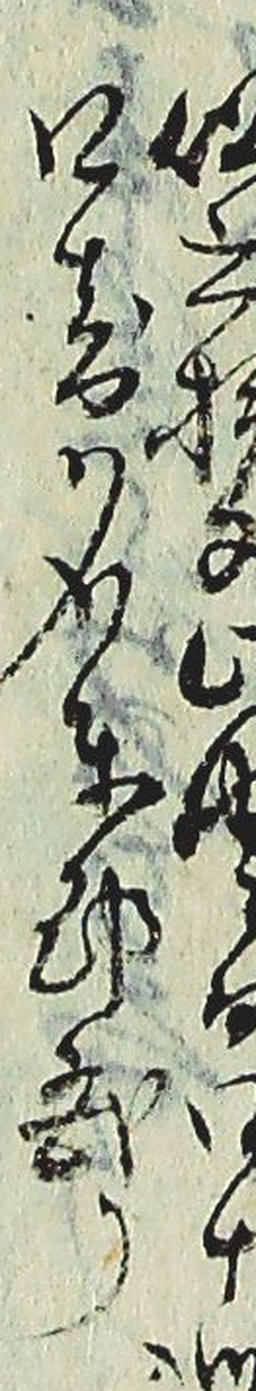四歩名東郡当り
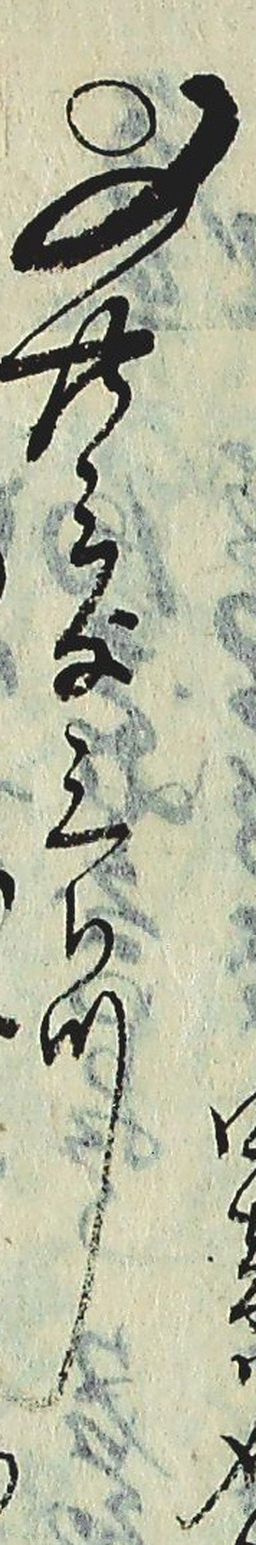〆廿三匁三分弐厘
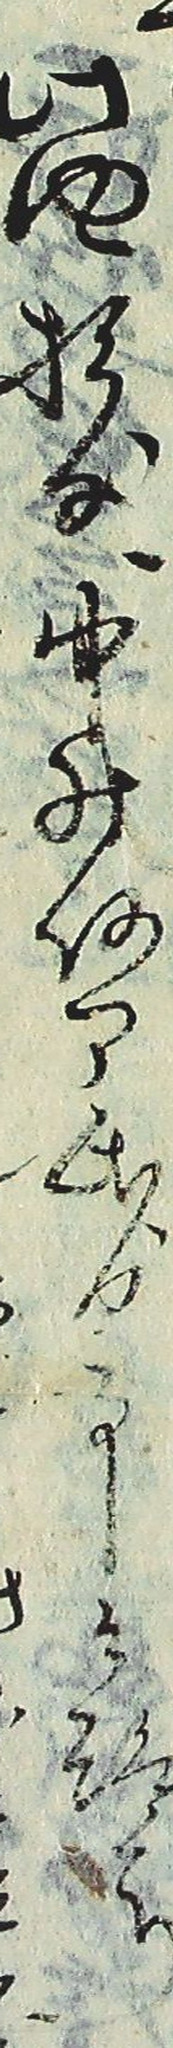此内拾匁中村阿部氏ゟ予相渡候分
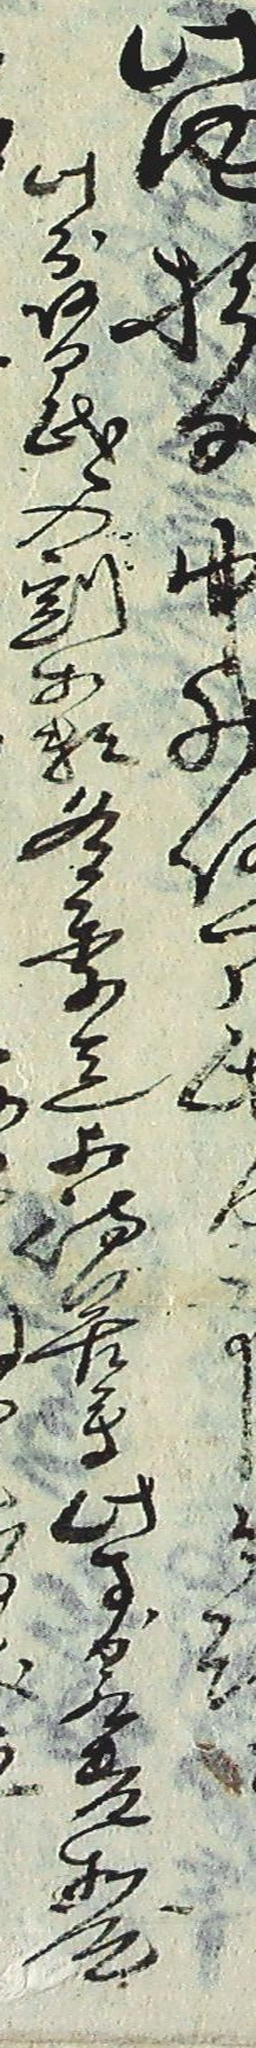此分阿部氏へ入割相頼冬季迄相待筈付此方ゟ取替相渡
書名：名東郡中諸割賦元帳
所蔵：鳴門教育大学 Naruto University of Education
